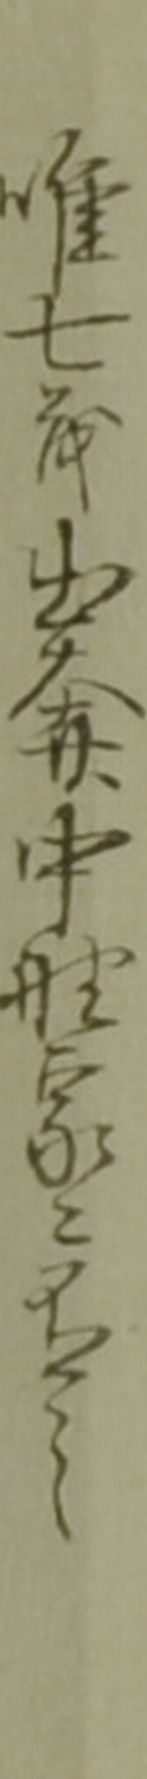唯七茂出奔中野家ニ有之
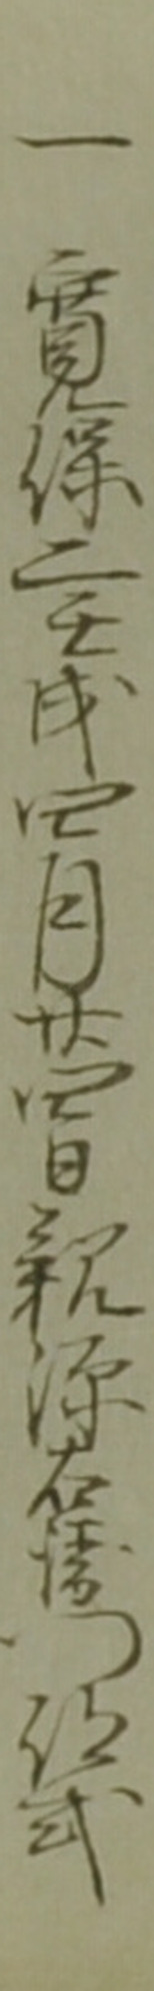一寛保二壬戌四月廿四日親源右衛門跡式
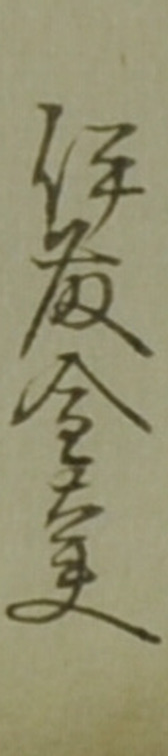伊藤金太夫
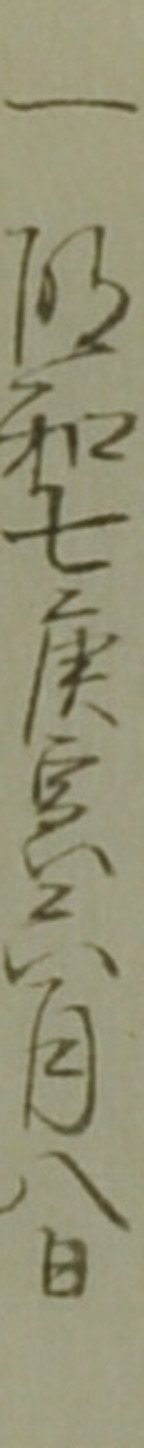一明和七庚寅六月八日
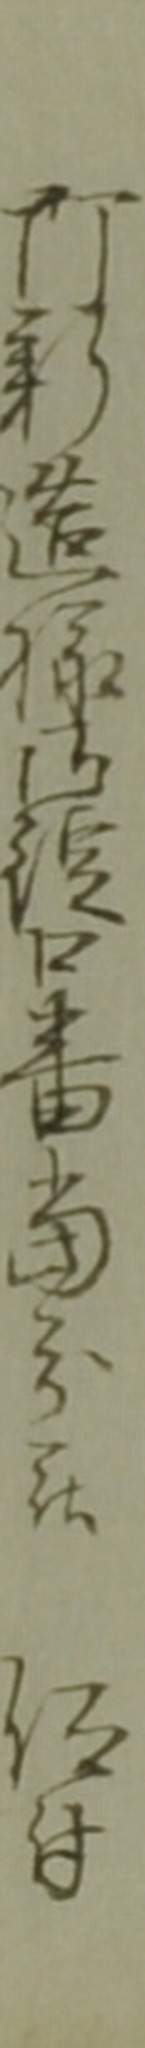御新造様御錠口番当分被仰付
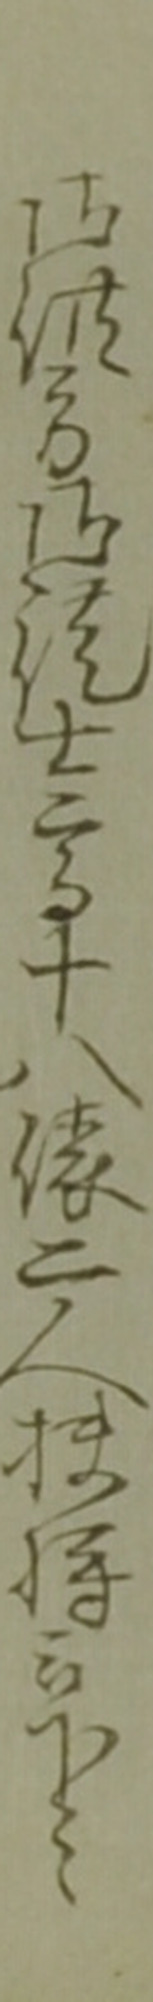御供方御徒士高十八俵二人扶持被下之
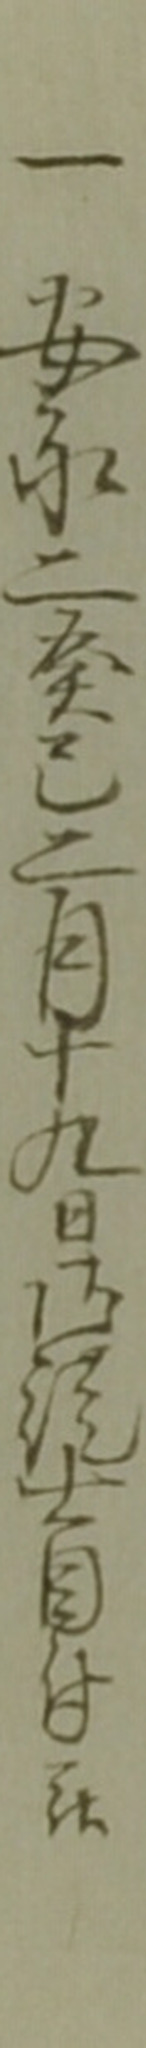一安永二癸巳二月十九日御徒士目付被
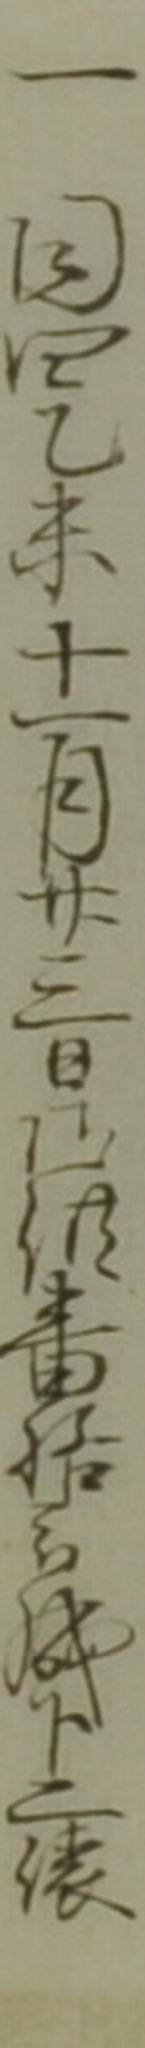一同四乙未十一月廿三日御供番格被成下二俵
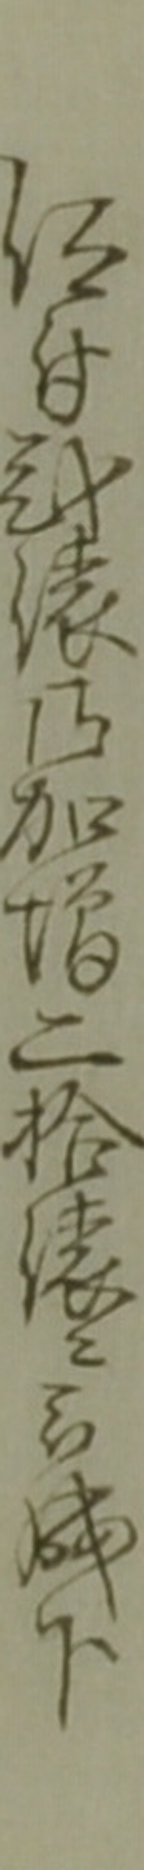仰付弐俵御加増二拾俵ニ被成下
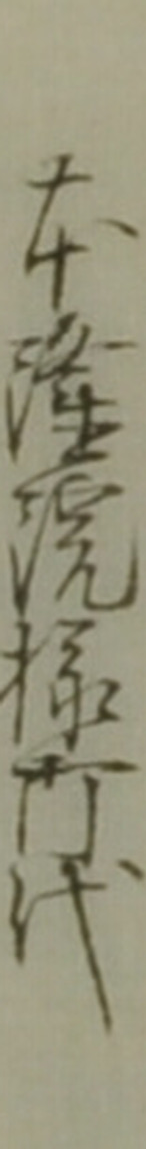本隆院様御代
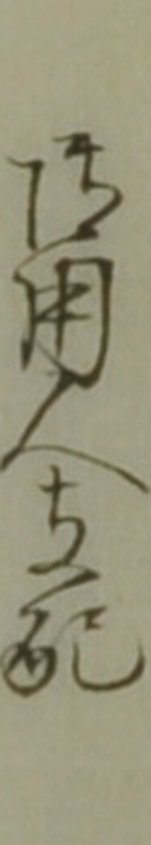御用人支配
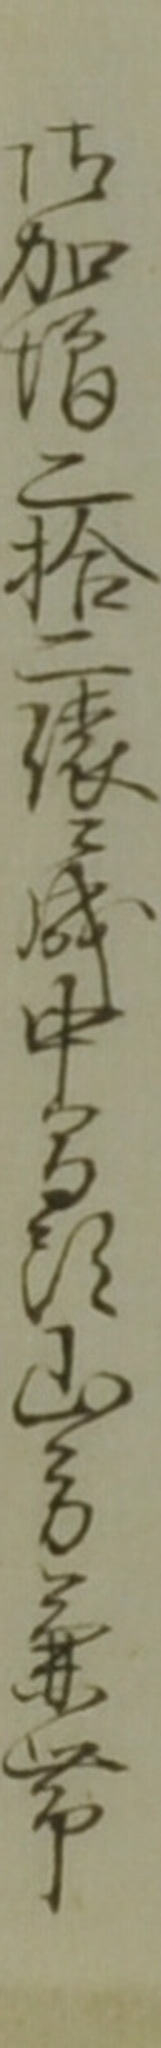御加増二拾二俵ニ成中間頭山方兼帯
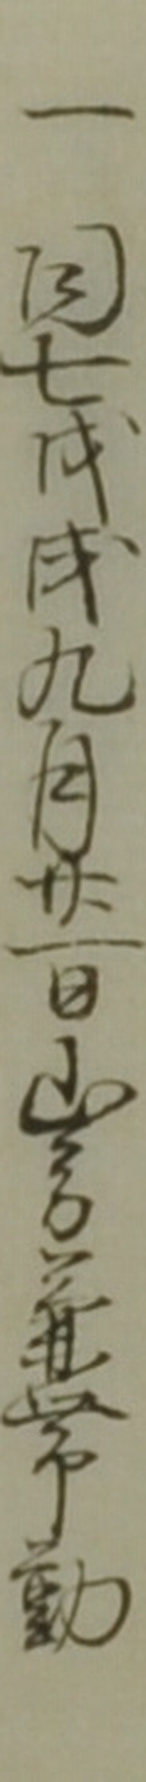一同七戊戌九月廿一日山方兼帯勤
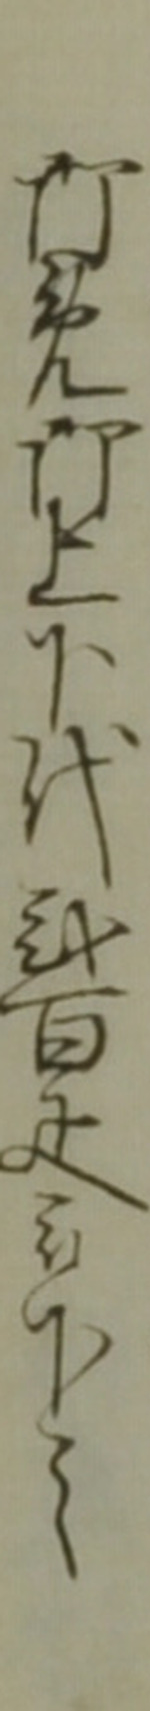御免御上下代弐百疋被下之
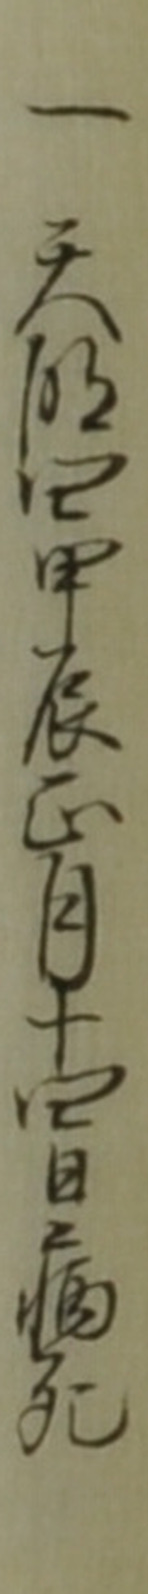一天明四甲辰正月十四日病死
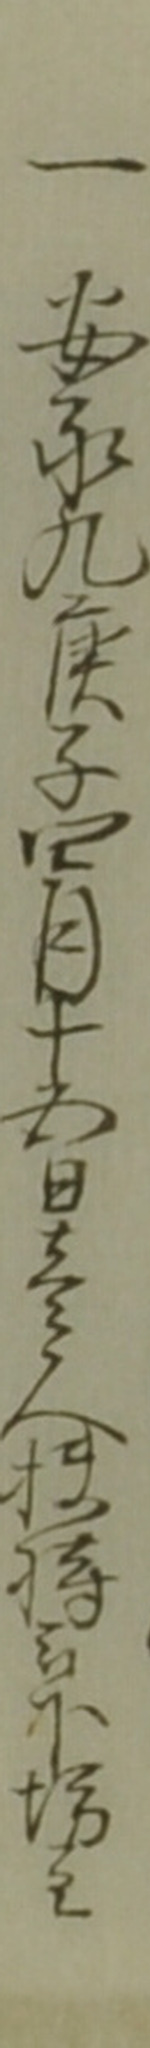一安永九庚子四月十五日壱人扶持被下坊主
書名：無足諸士勤仕録（一）
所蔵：伊那市立高遠町図書館・合同会社AMANE
